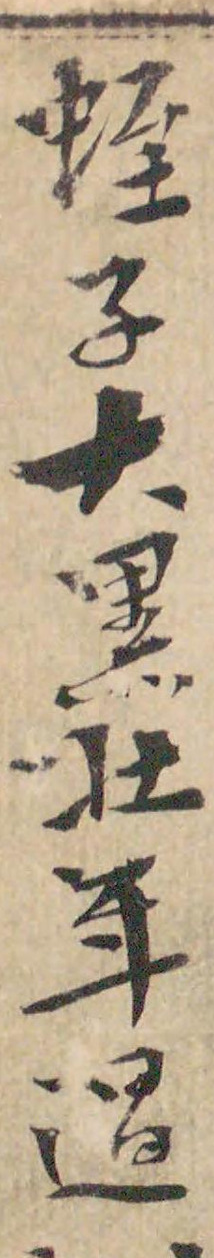蛭子大黒壮年過

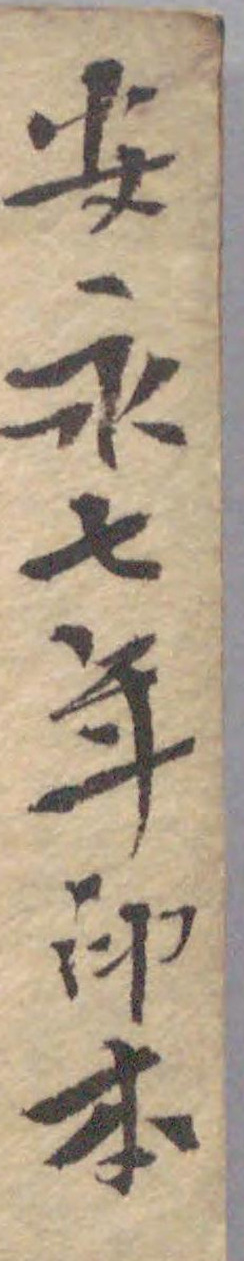安永七年印本

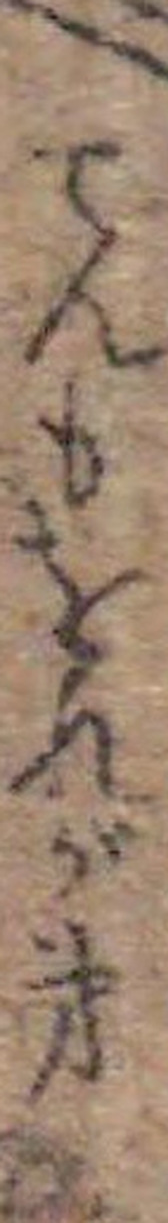てんもをれが弟
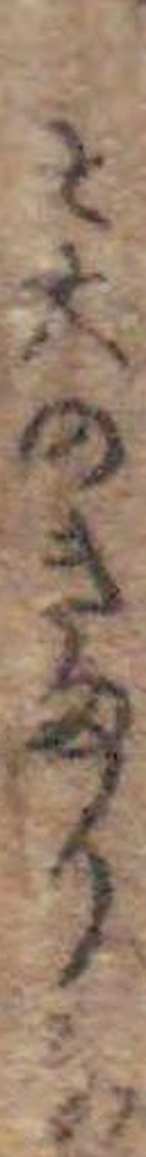と大のきまりな
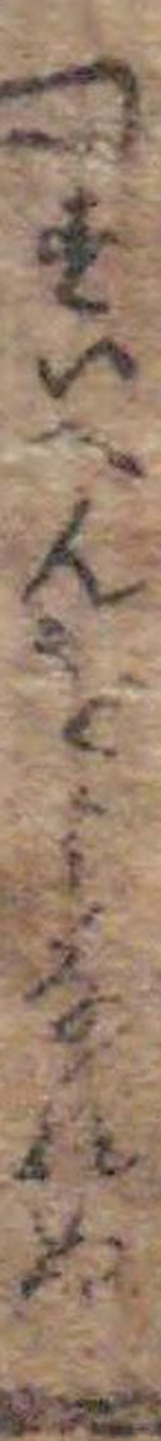すいへんをしなれぬ
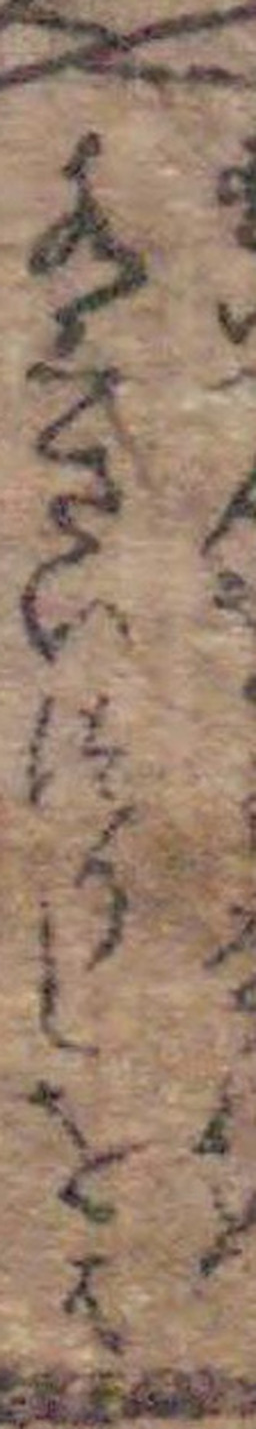水くさいつりしをは
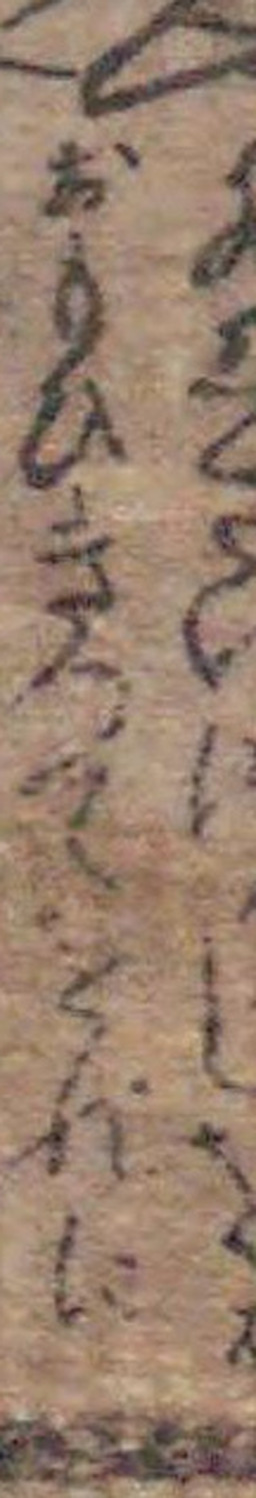おもひきつてをれに
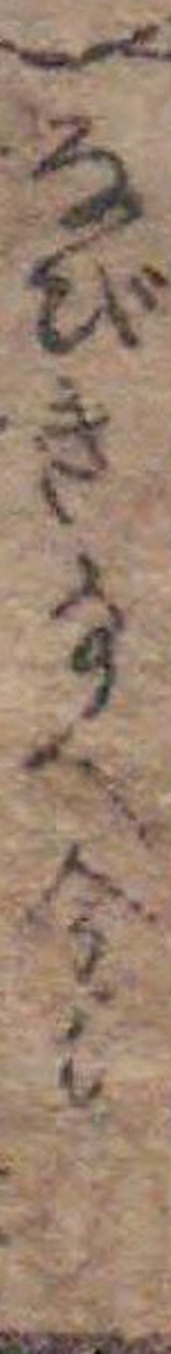なびきなへ金も
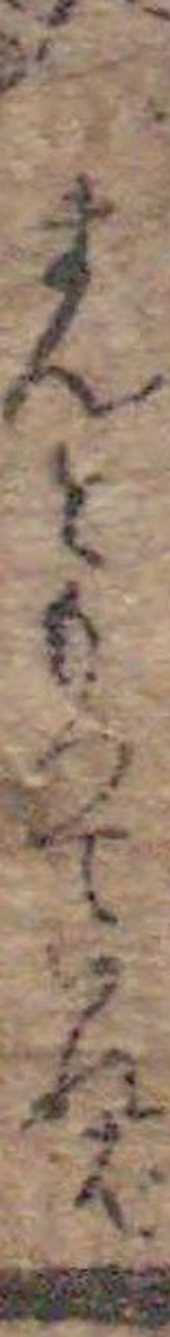まんともつていれば
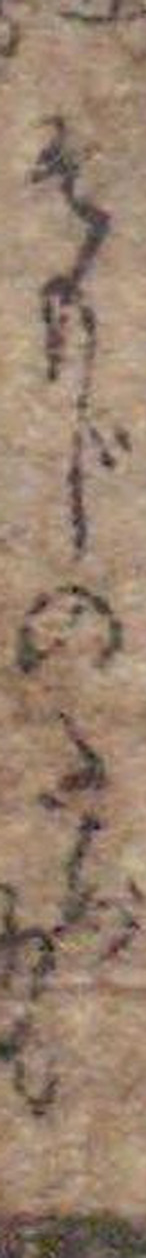そもじのためにも
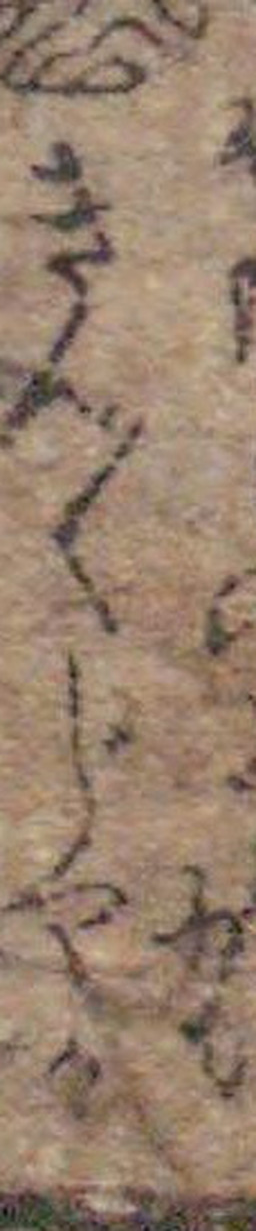きん〳〵じやか
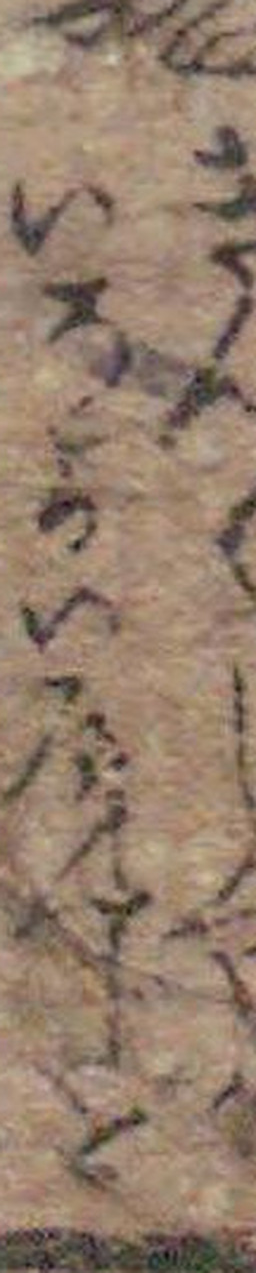いろよいへんじを

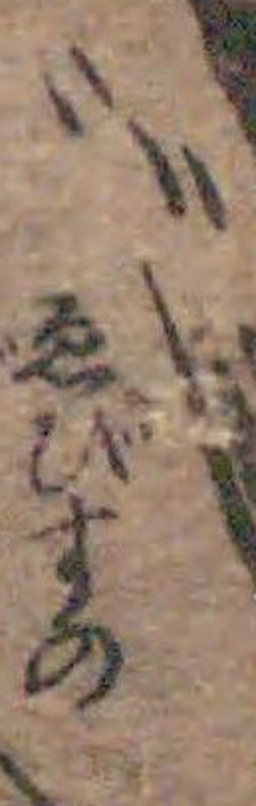ゑびすの
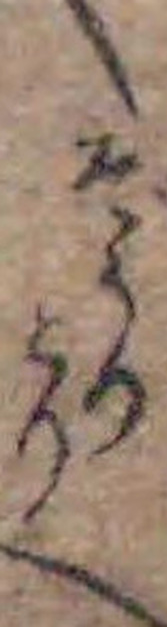ぞうり
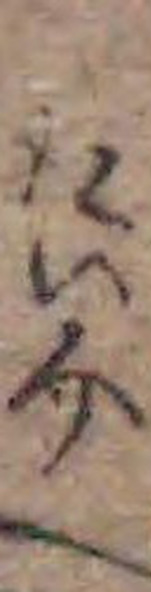たい介
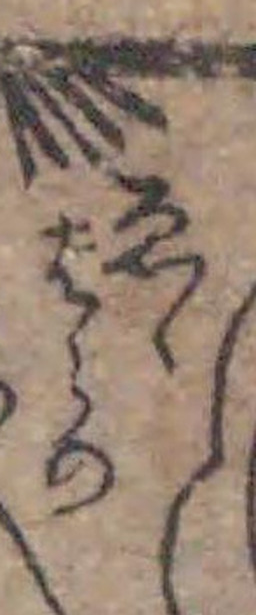はらの
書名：蛭子大黒壮年過 : 2巻
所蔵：国立国会図書館 National Diet Library, JAPAN
